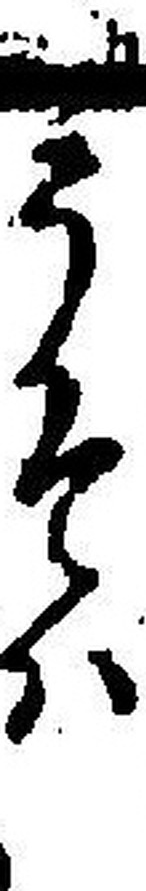うそは
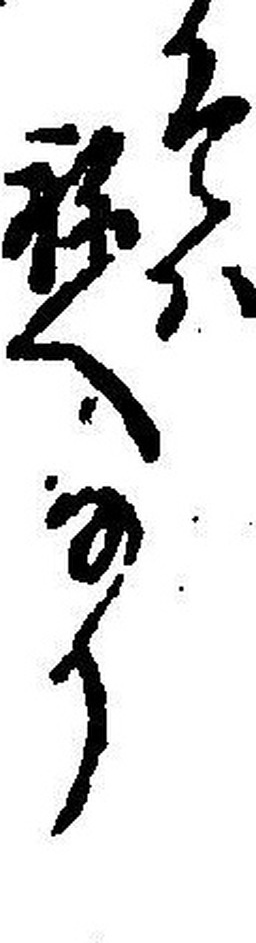ねへなり
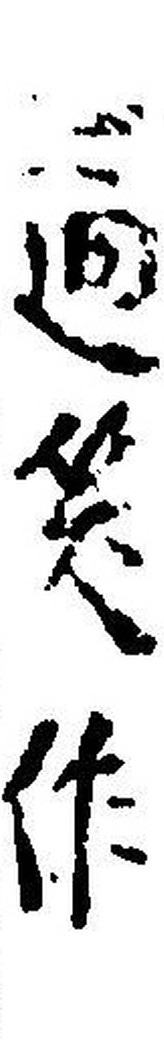通笑作
